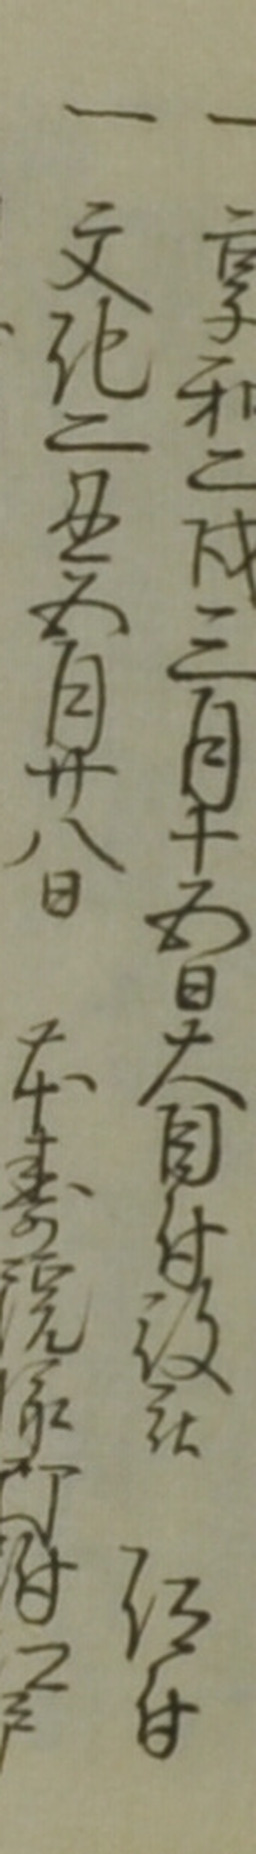一文化二丑五月廿八日本寿院様御附江戸
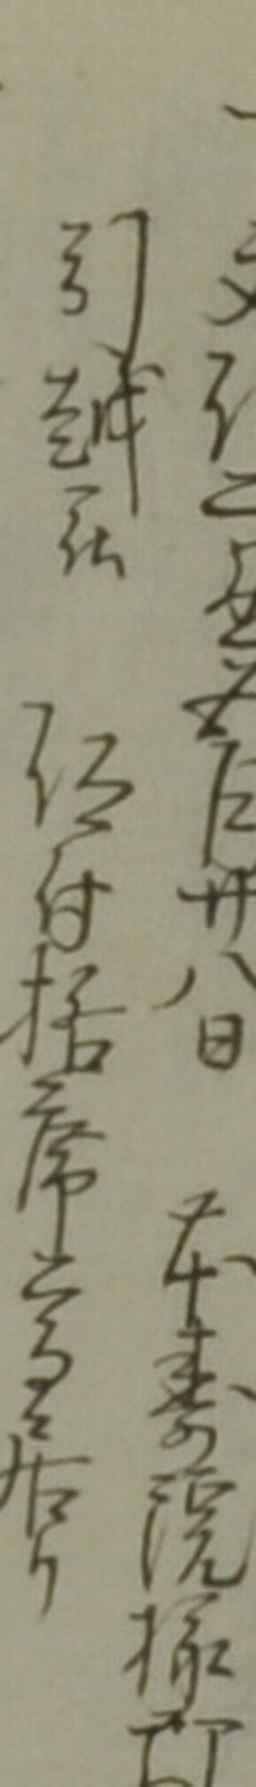引越被仰付格席高居リ
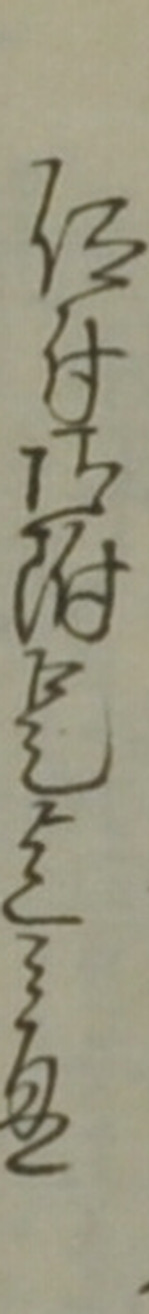仰付御附是迄之通
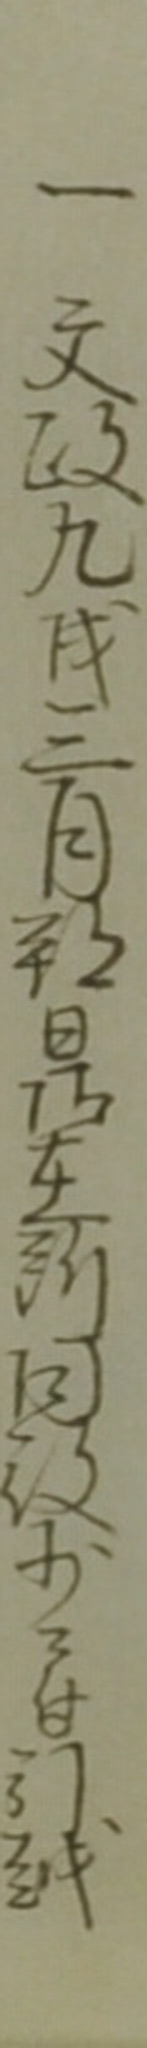一文政九戌三月朔日御在所同役少ニ付引越
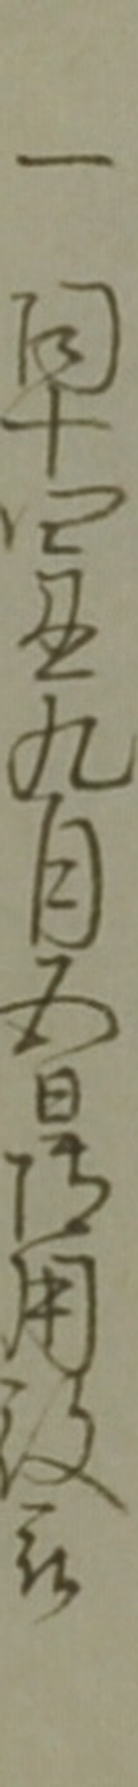一同十四丑九月五日御用役被
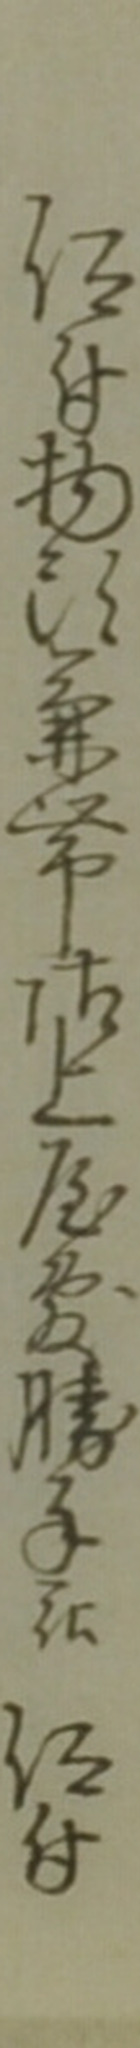仰付物頭兼帯御上屋敷勝手被仰付
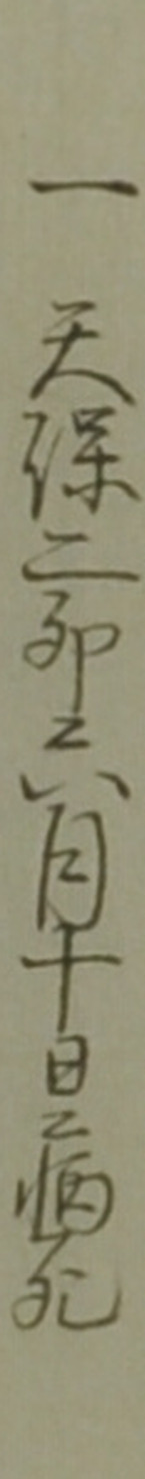一天保二卯六月十日病死
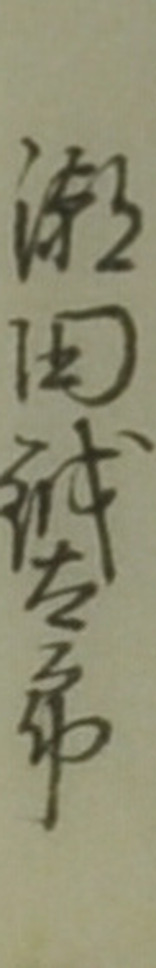潮田鉞太郎
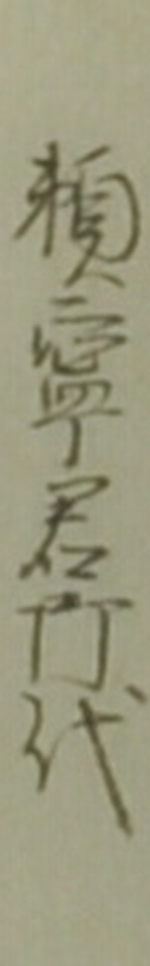頼寧君御代

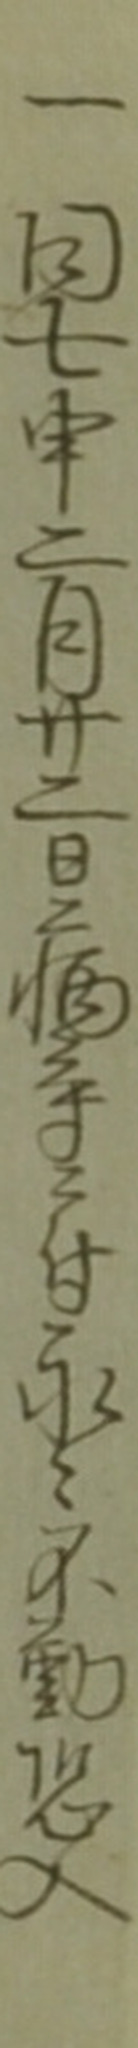一同七申二月廿二日病気ニ付永々不勤恐入
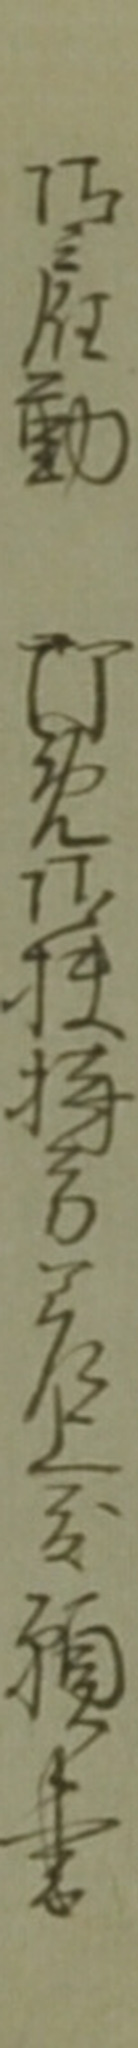御雇勤御免御扶持方差上度願書
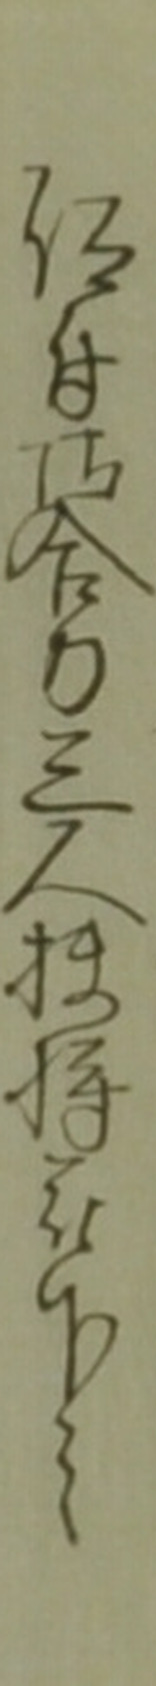仰付御合力三人扶持被下之
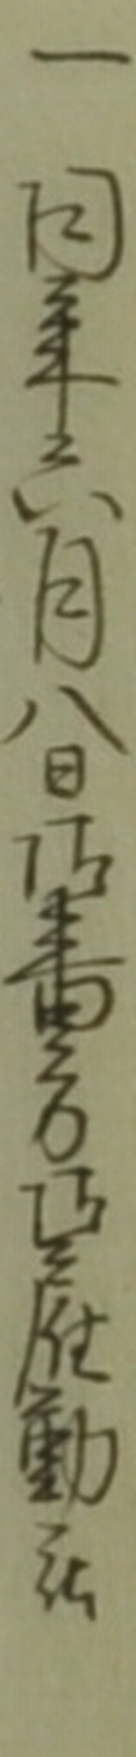一同年六月八日御番方御雇勤被
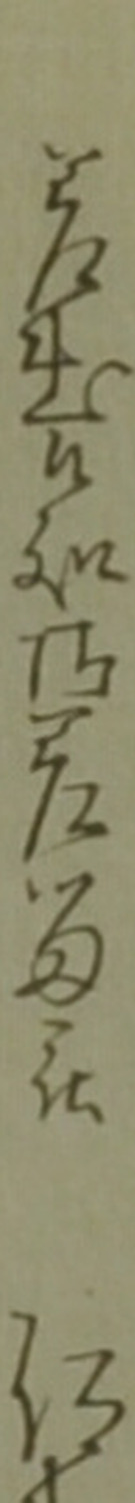差出候処御差留被仰出
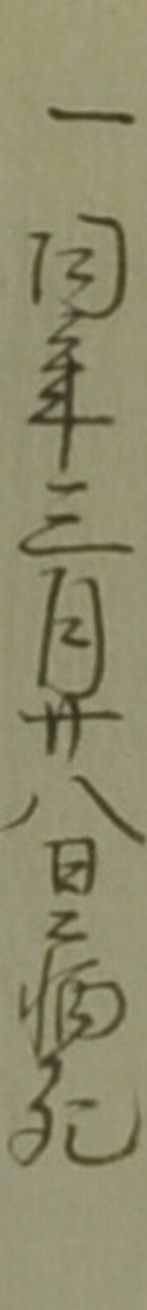一同年三月廿八日病死
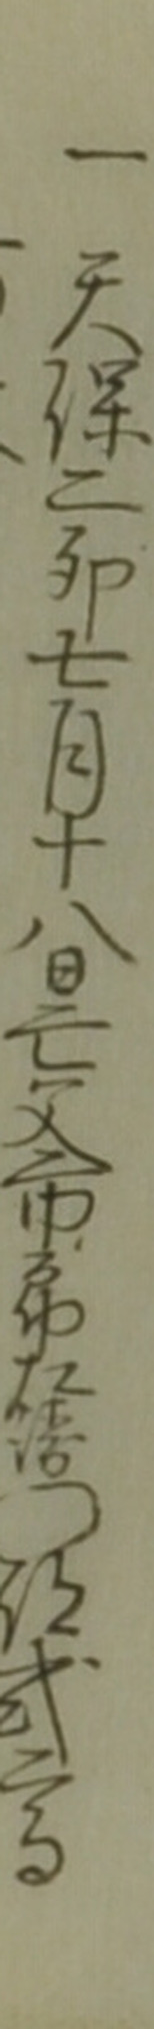一天保二卯七月十八日亡父市郎左衛門跡式高
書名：給人諸士勤仕録（三）
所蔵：伊那市立高遠町図書館・合同会社AMANE
